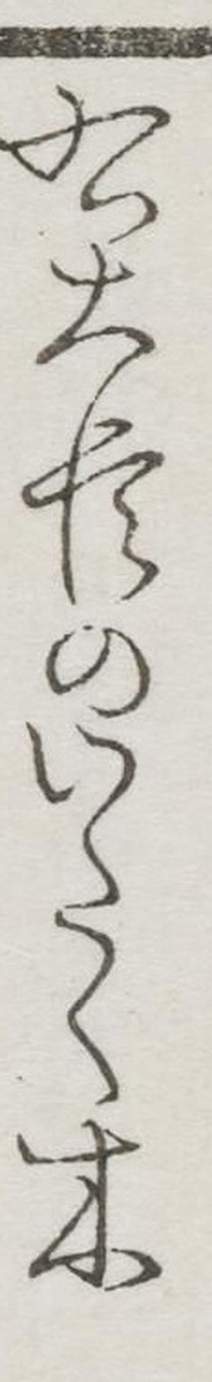右大臣のいたゝく木
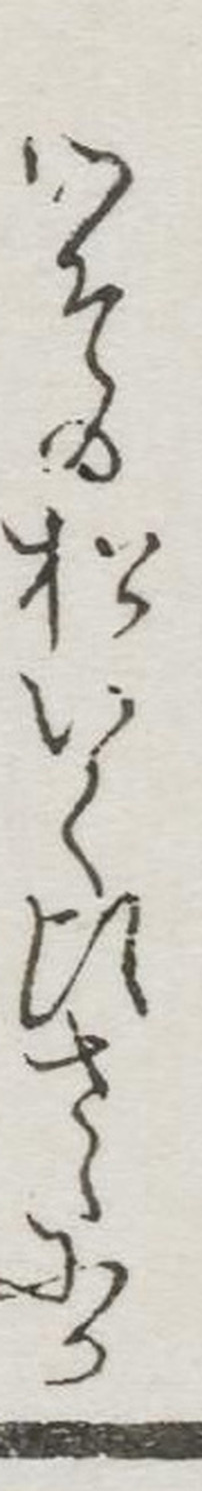いその松いくひさゝにか
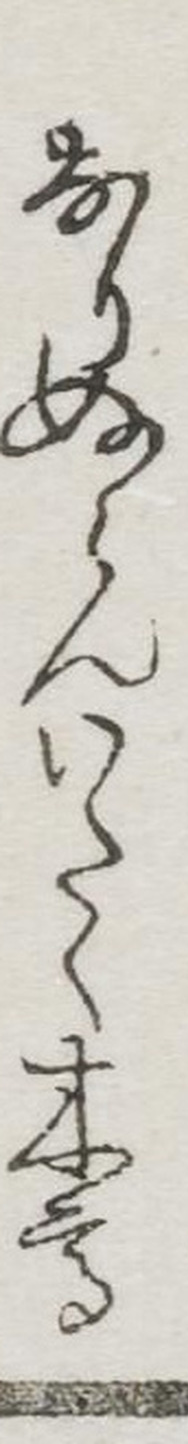なりぬらんいたく木高
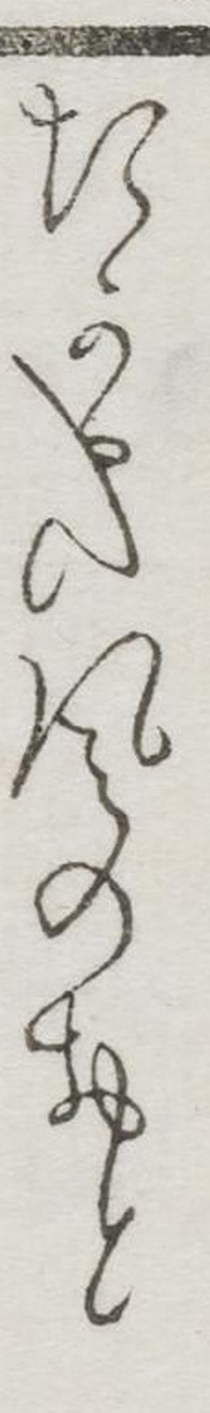たかき風のおと
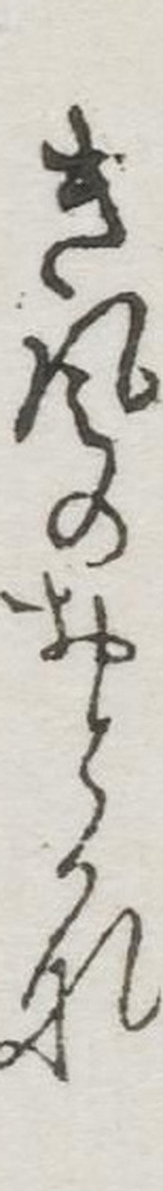き風のおとかな
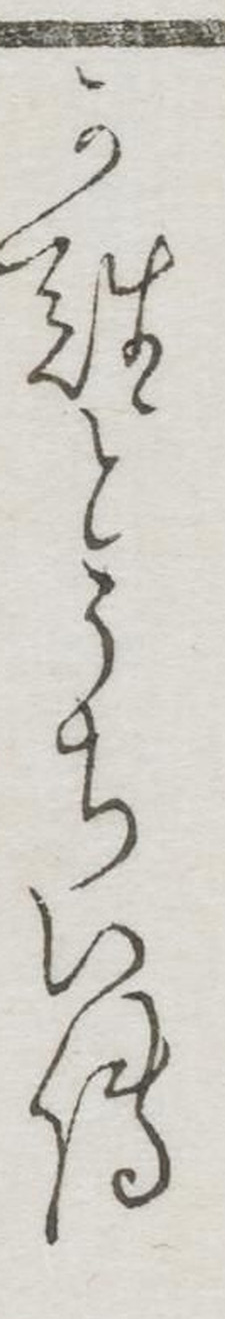かなとうちいて
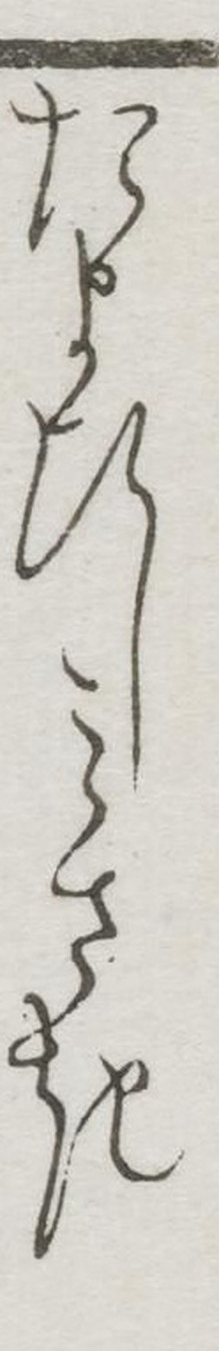たまひしみさき
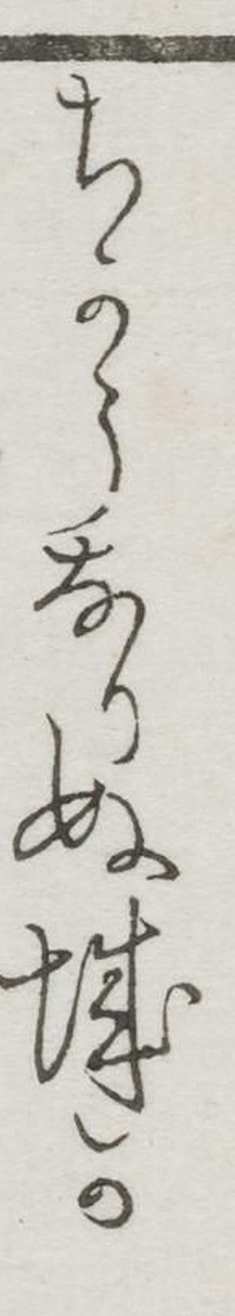ちかうなりぬ城か
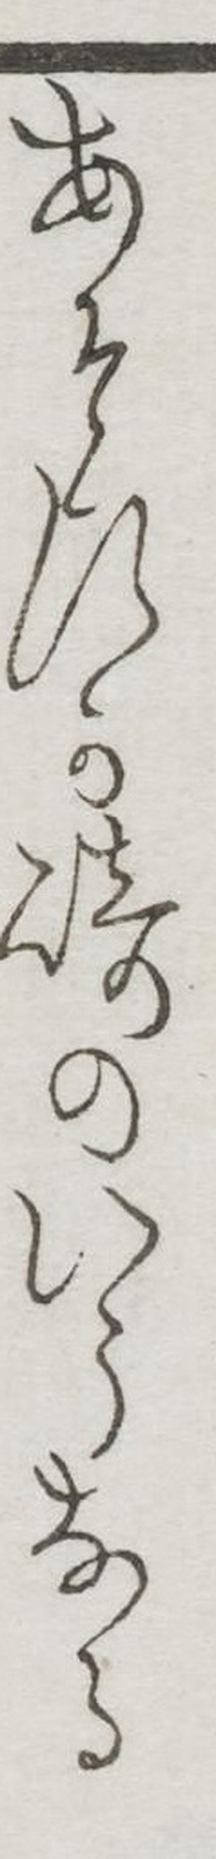あそひか崎のいうなる
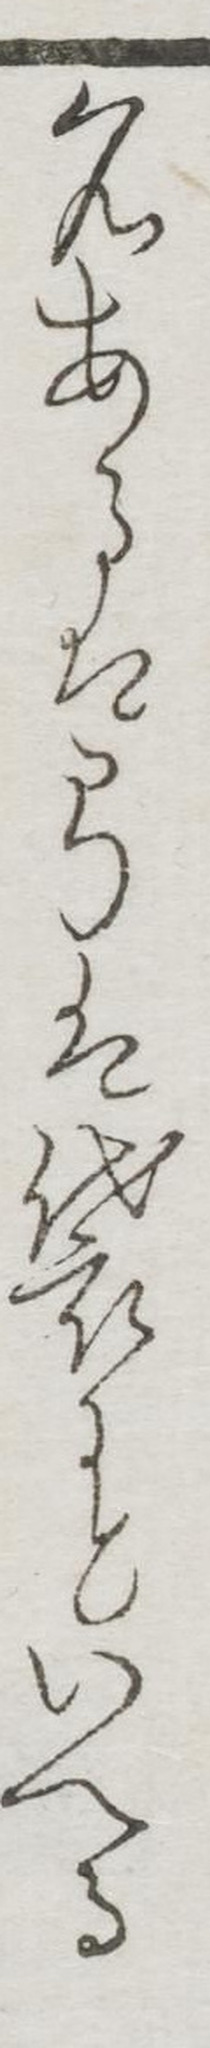名あるは弓は袋にといへる
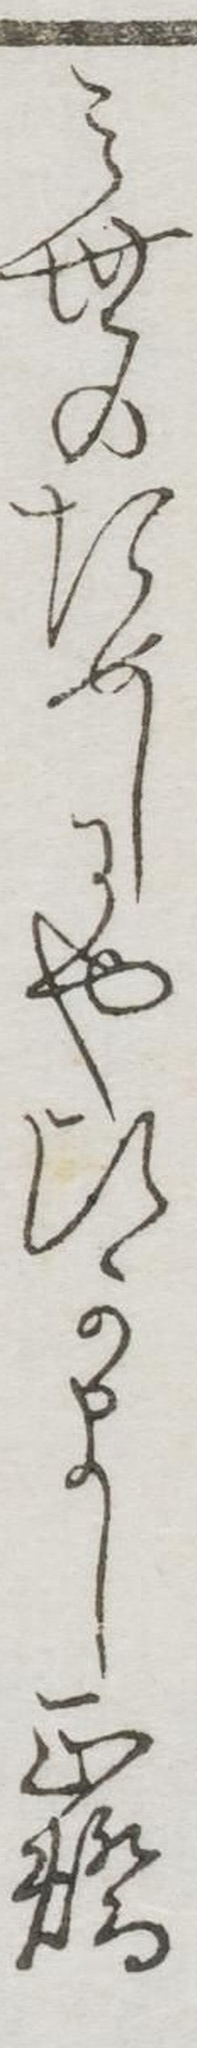み世のためしにやひかまし正矯
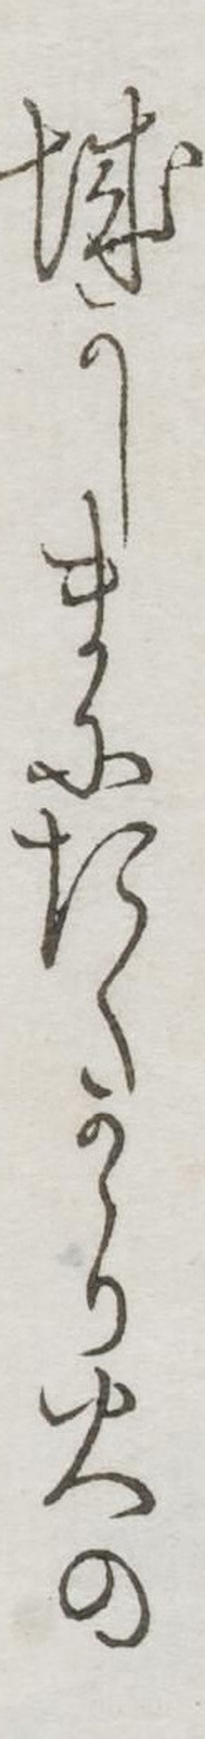きかしまにたくかゝり火の

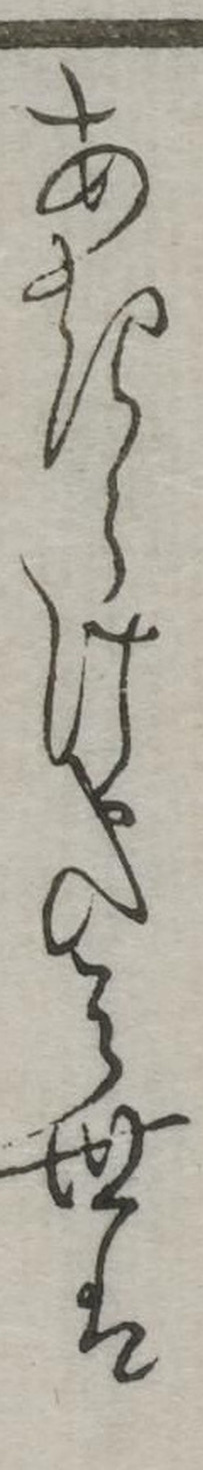あきらけきみ世は
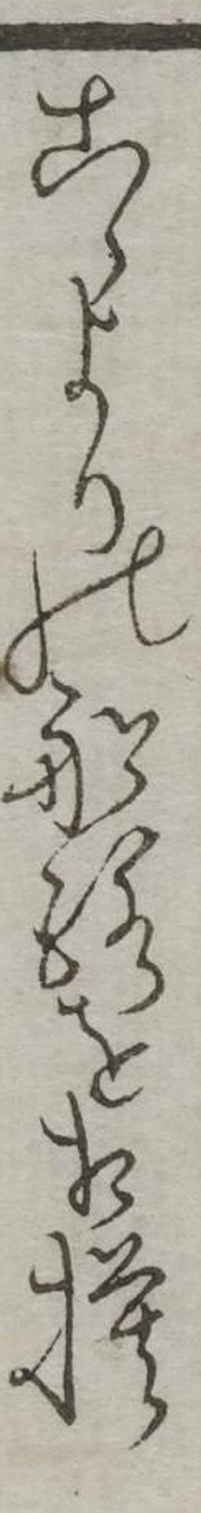こゝよりの船路を相模
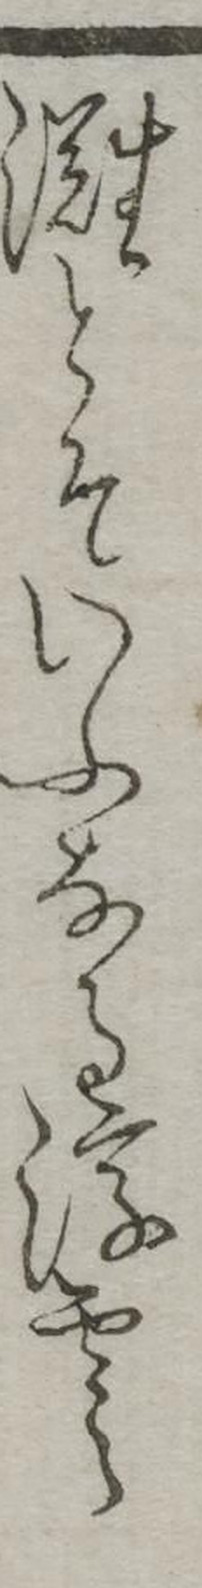灘とそいふなる浮雲
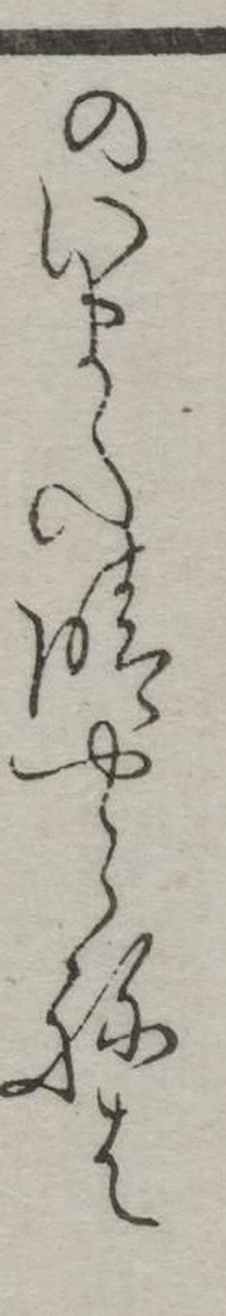のいまた晴やらねは
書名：挿画熱海日記　全
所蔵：東京大学地震研究所図書室 Earthquake Research Institute Library, The University of Tokyo, JAPAN
